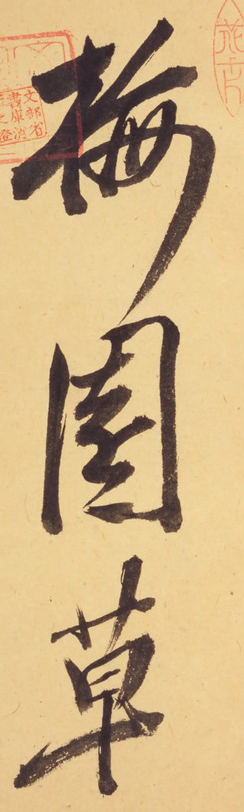梅園草
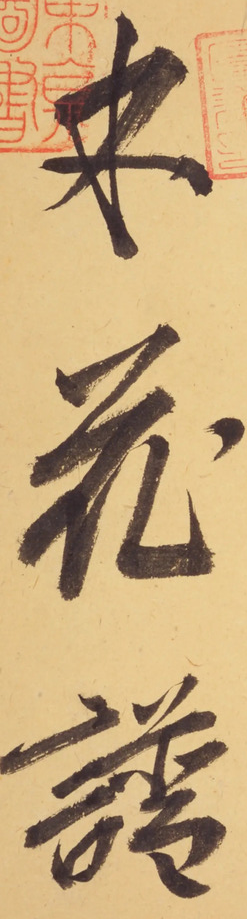木花譜

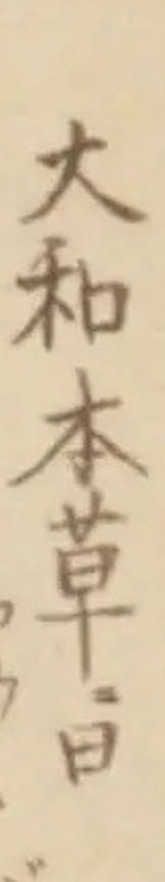大和本草ニ曰
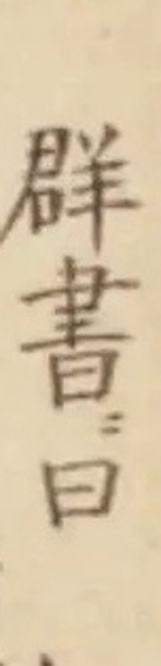群書ニ曰
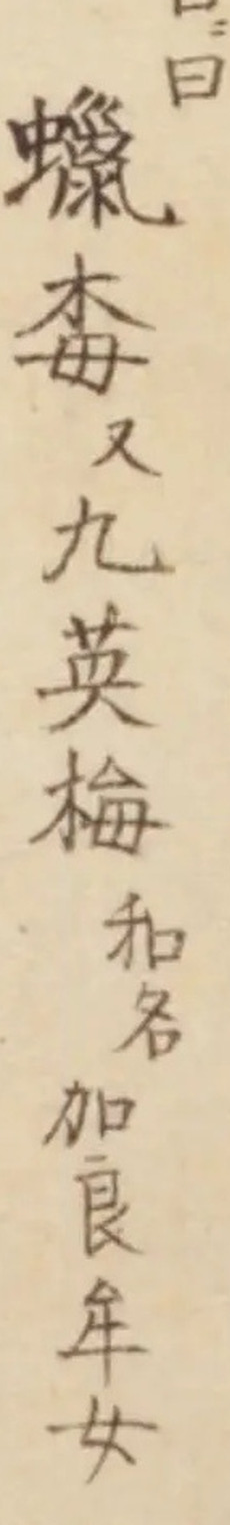蠟又九英梅和名加良牟女
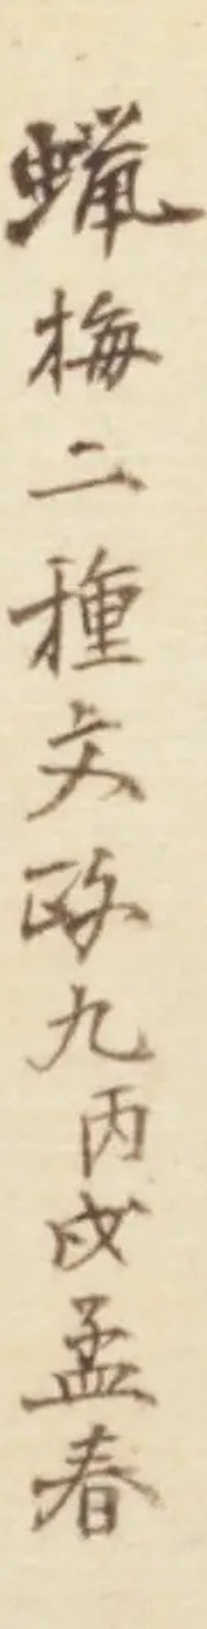蠟梅二種文政九丙戌孟春
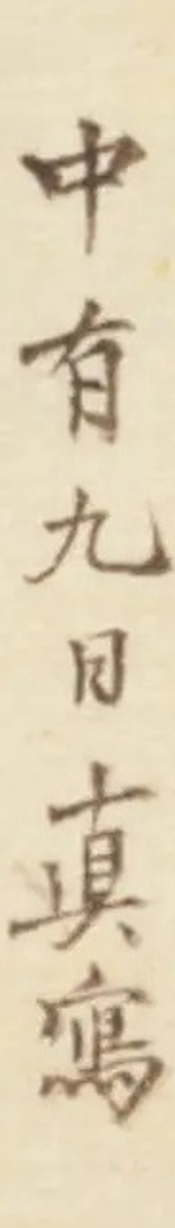中有九日真写
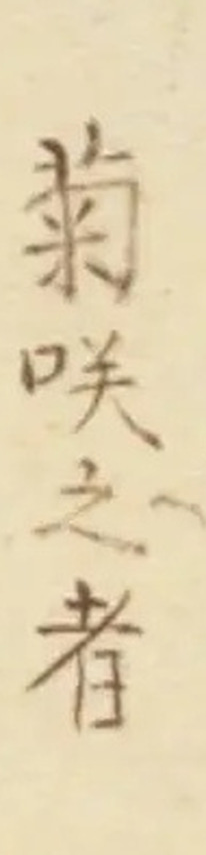菊咲之者

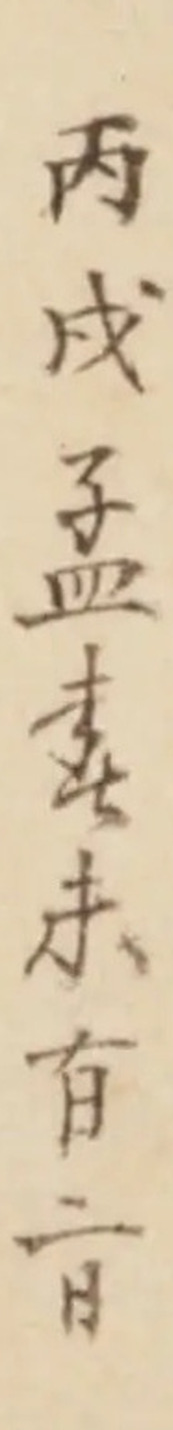丙戌孟春末有二日
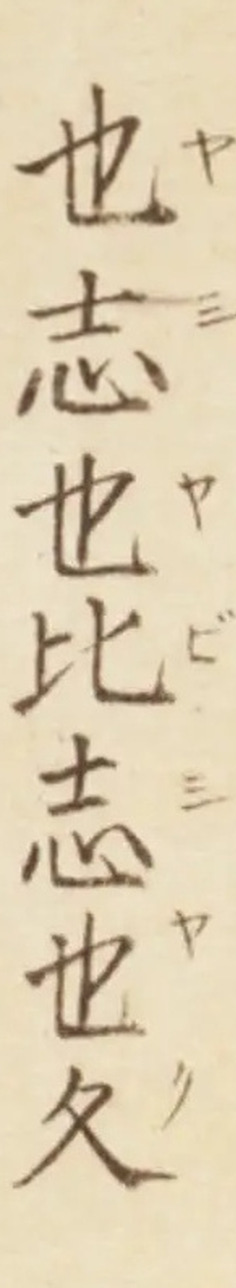也志也比志也久
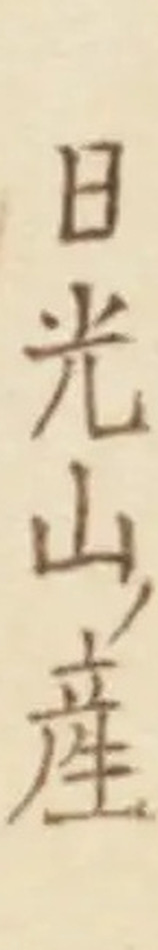日光山ノ産

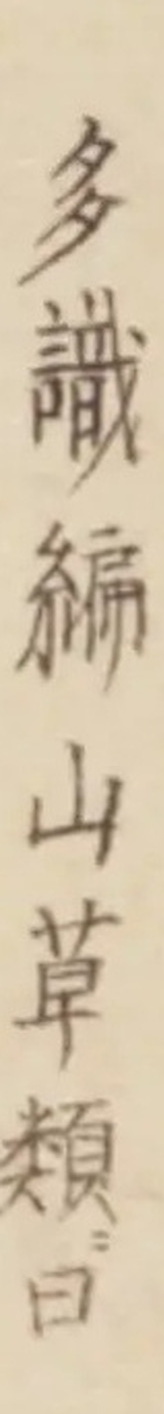多識編山草類ニ曰
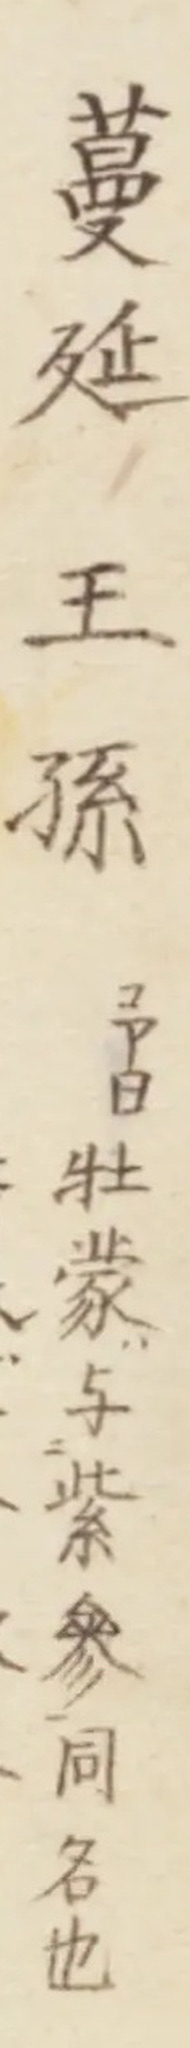蔓延王孫予曰牡蒙ハ与紫參同名也
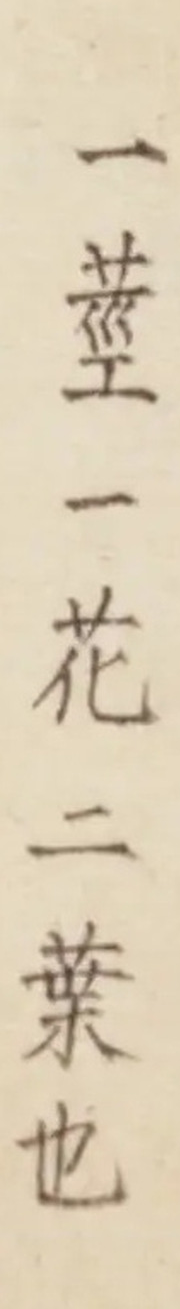一茎一花二葉也
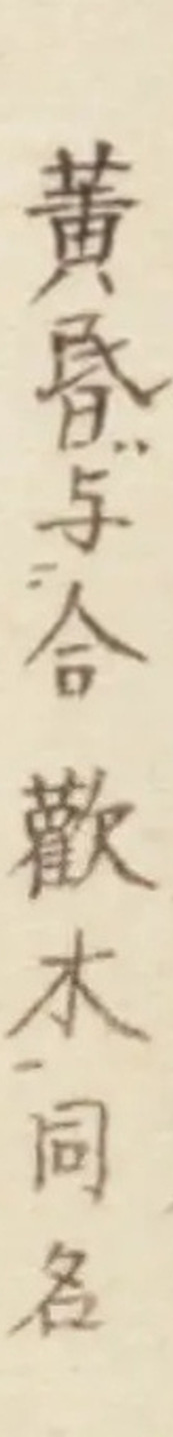黄昏与合歓木同名
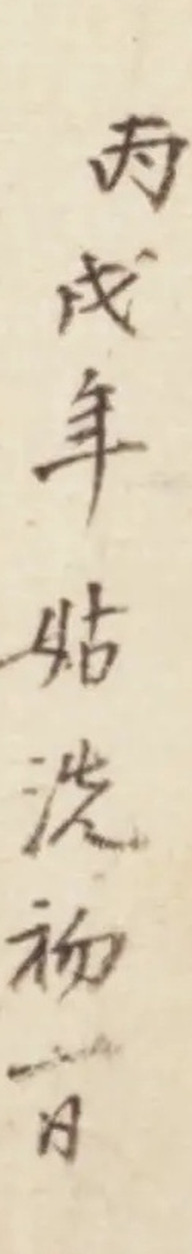丙戌年姑洗初一日
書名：梅園草木花譜春之部. 3
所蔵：国立国会図書館 National Diet Library, JAPAN
